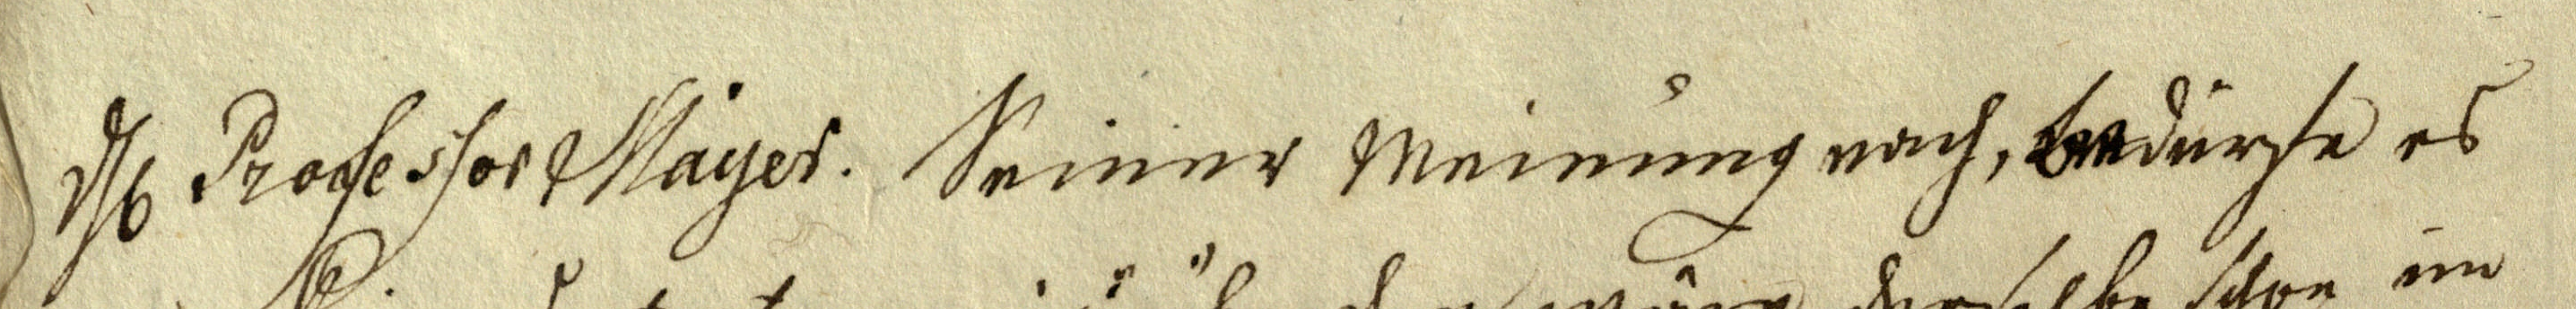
dh Professor Maÿer. Seiner Meinung nach, bedürfe es
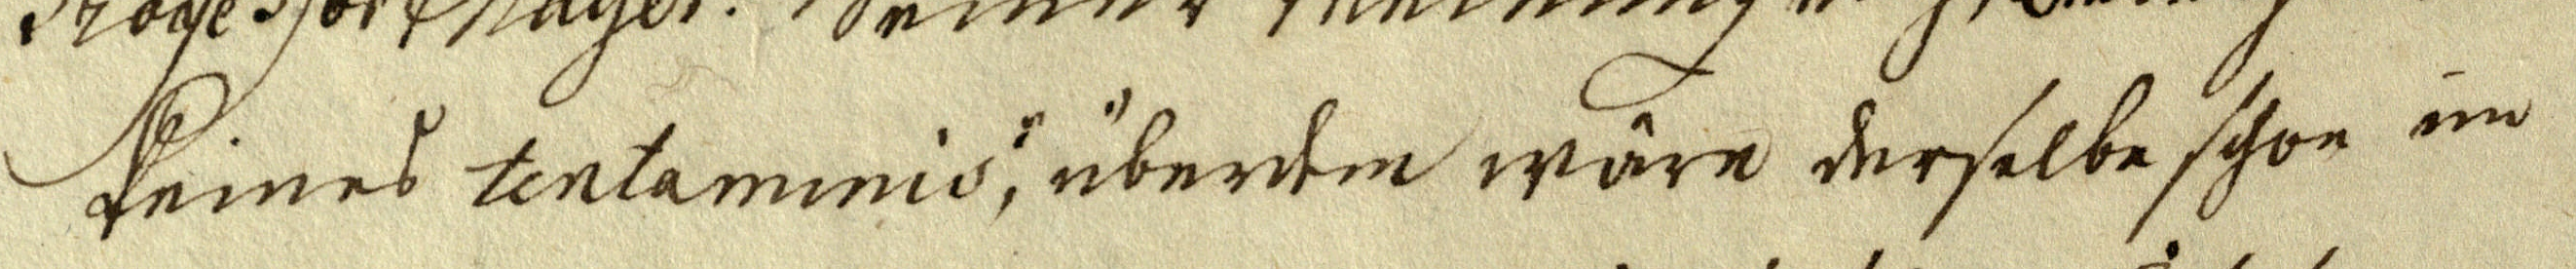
keines tentaminis, überdem wäre derselbe schon im
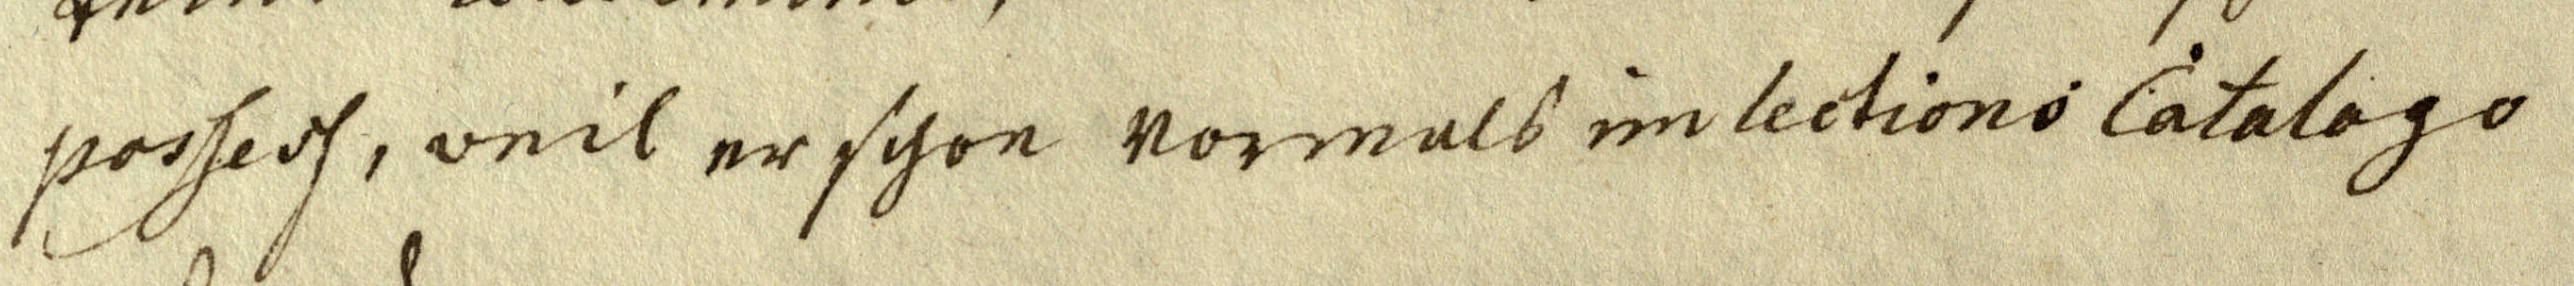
possess, weil er schon vormals im lections Catalogo
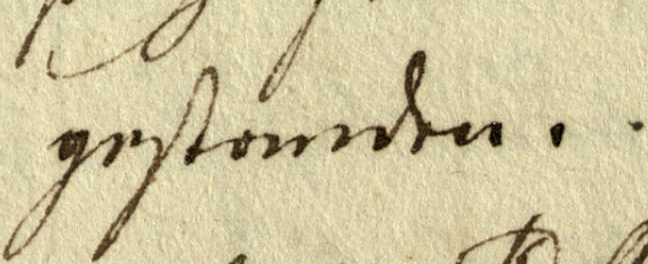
gestanden.
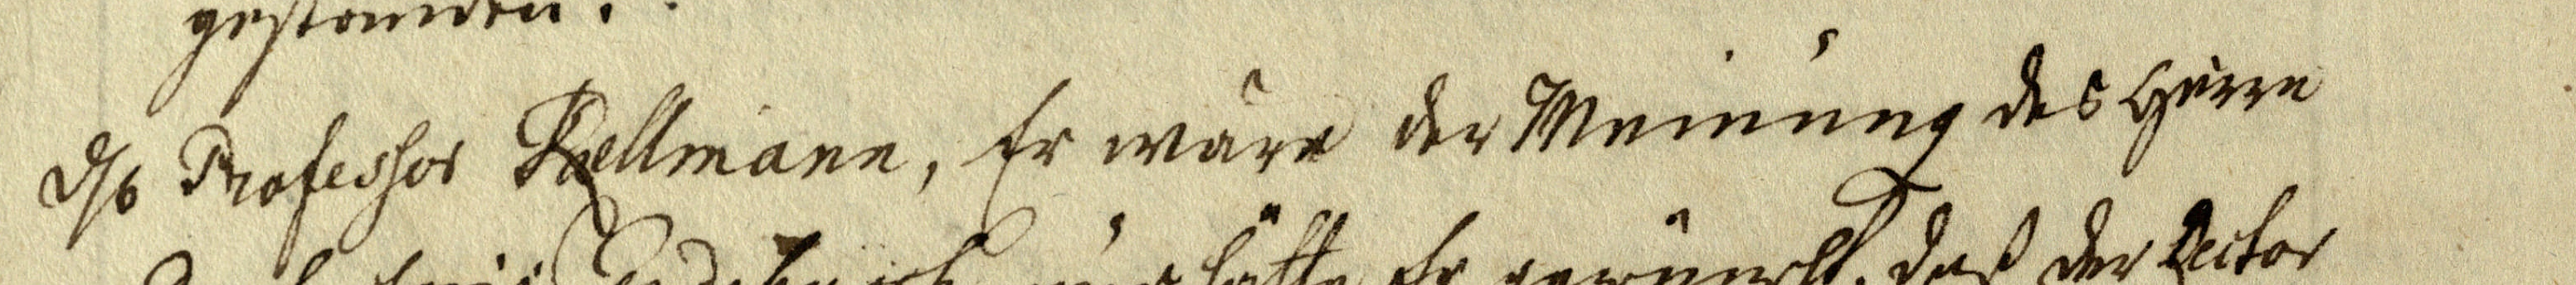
dh Professor Kellmann, Er wäre der Meinung des Herrn
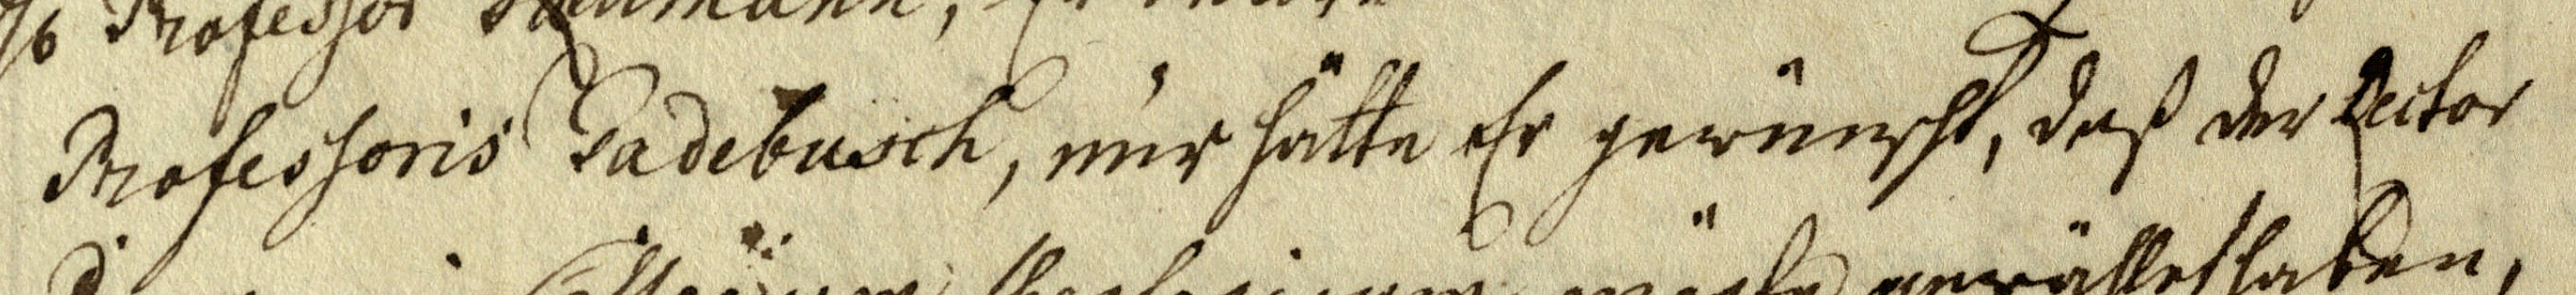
Porfessoris Gadebusch, nur hätte Er gewünscht, daß der Rector
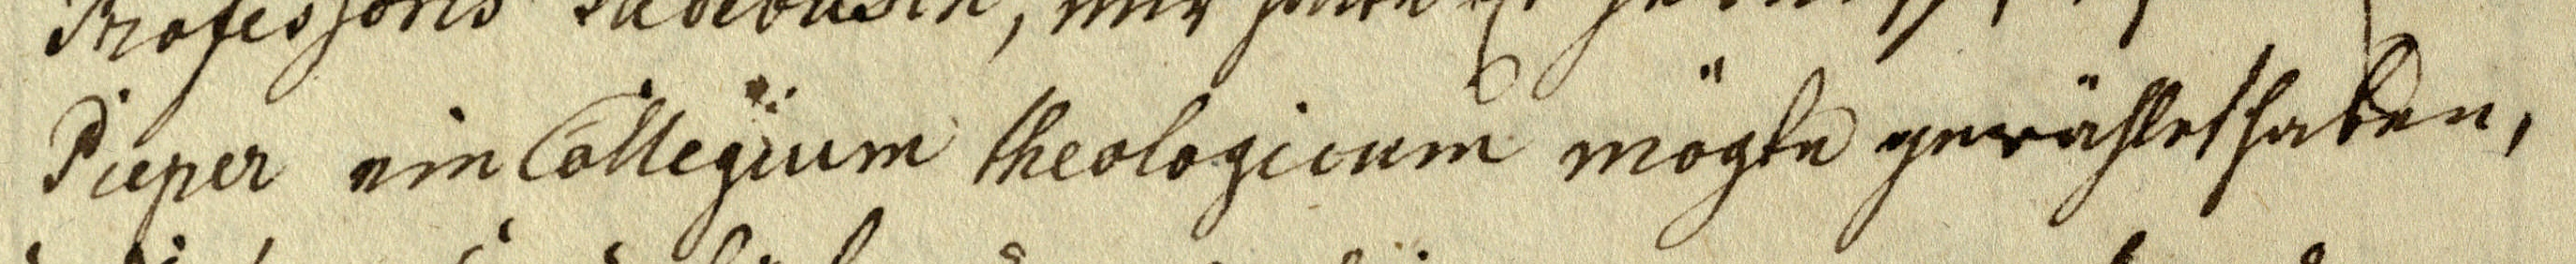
Pieper ein Collgium theologicum mögte gewählet haben,
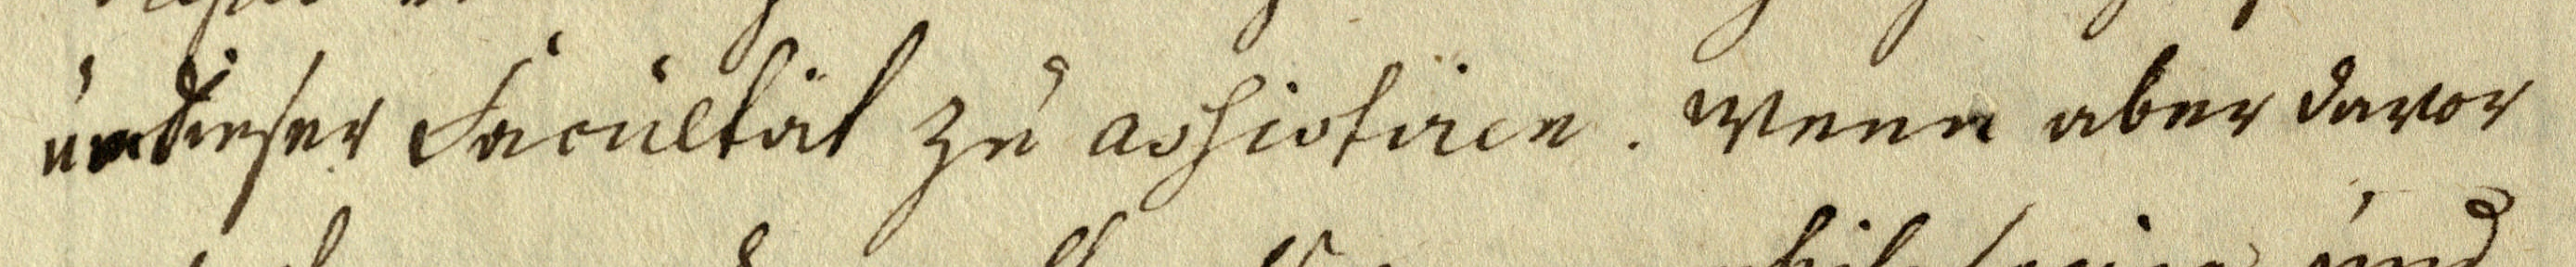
um dieser Facultät zu assistiren. wenn aber davor
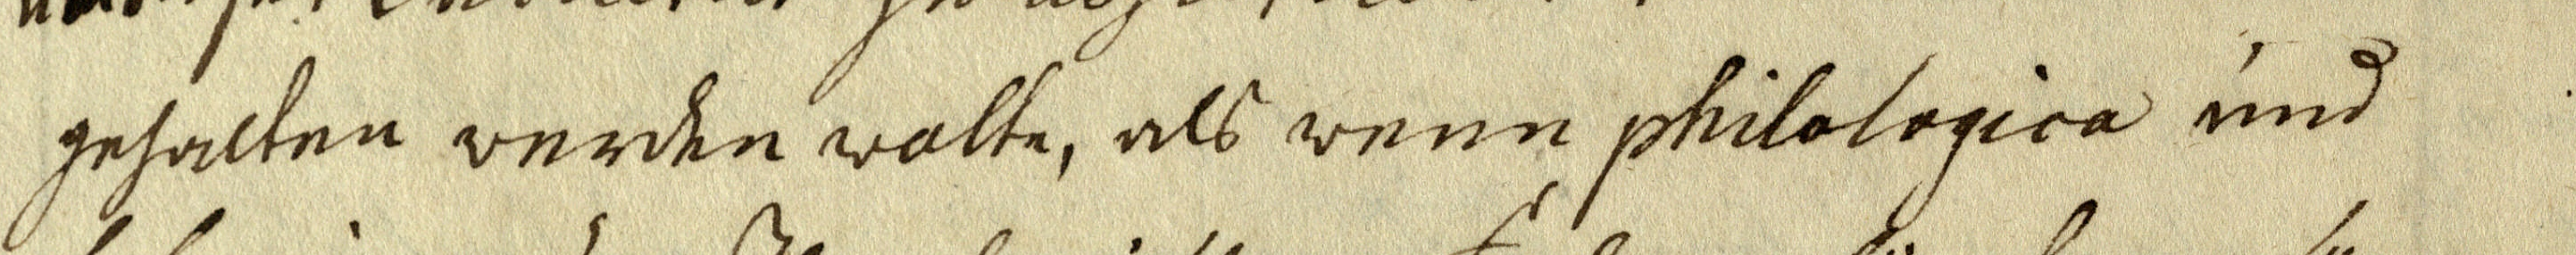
gehalten werden wolte, als wenn philologica und
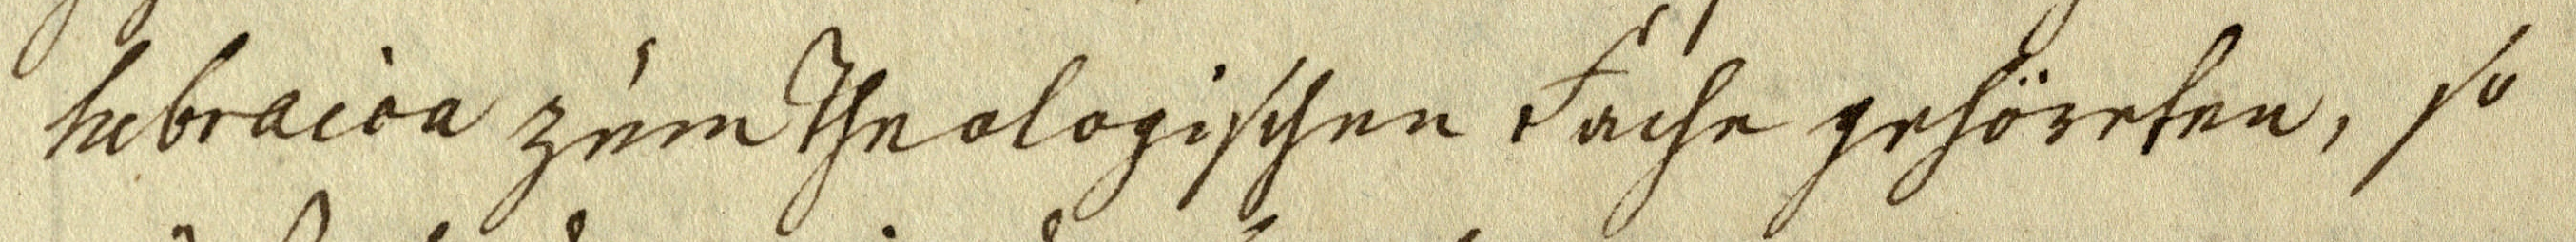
hebraica zum Theologischen Fache gehörten, so
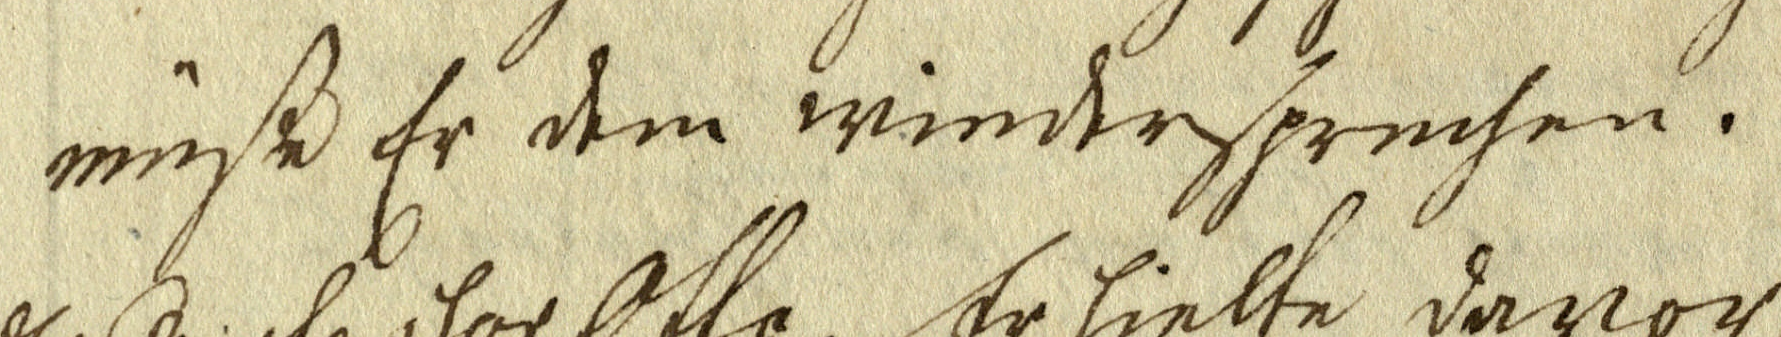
müße Er dem wiedersprechen.
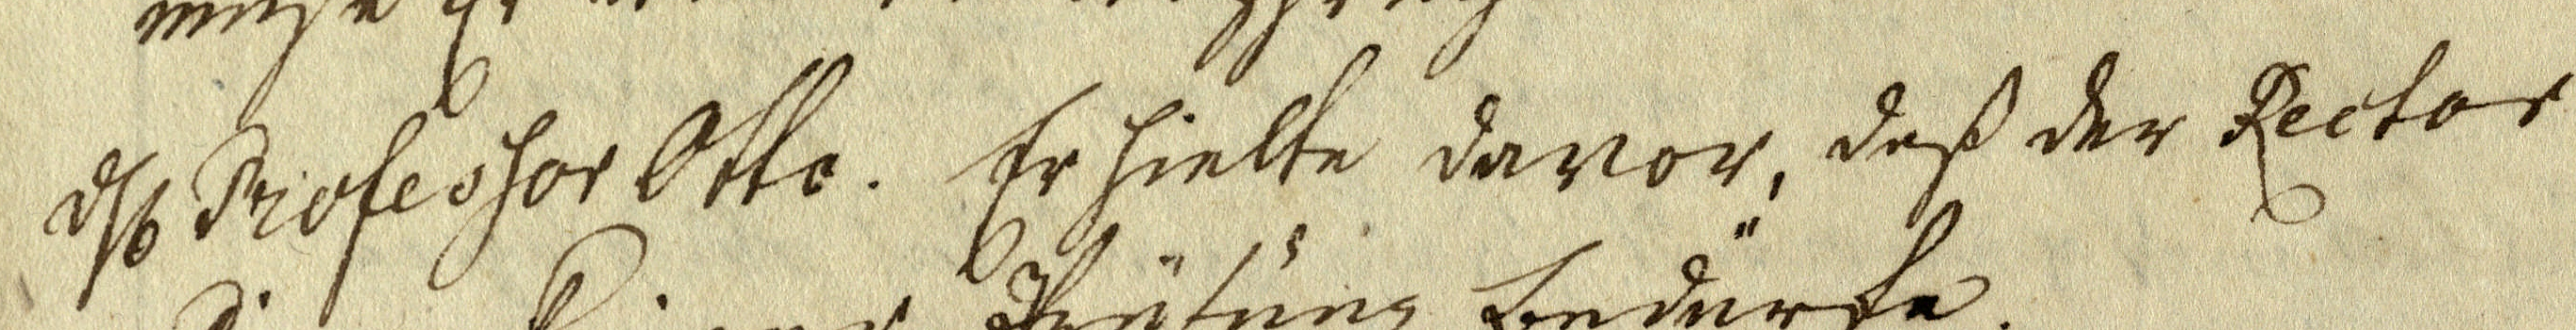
dh Professor Otto. Er hielte davor, daß der Rector
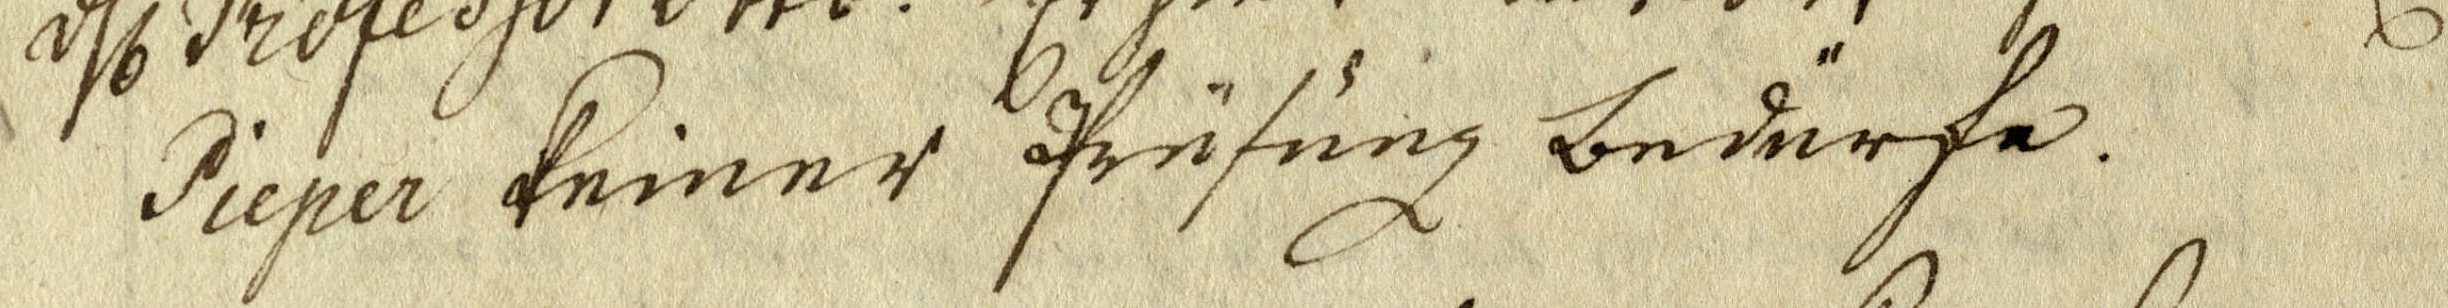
Pieper keiner Prüfung bedürfe.
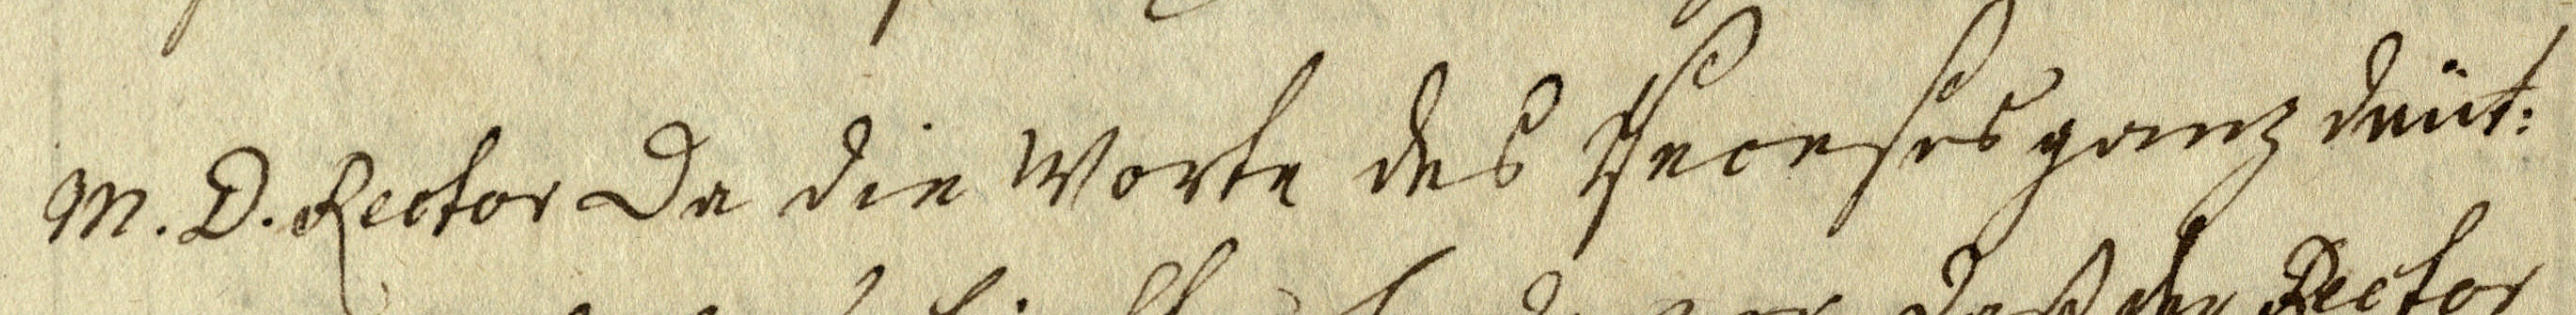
M. D. Rector da die Worte des Receßes ganz deut¬
